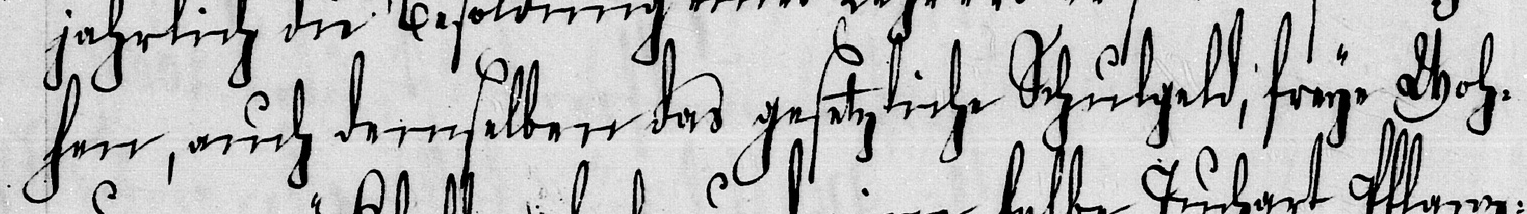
hen, auch demselben das gesetzliche Schulgeld; freye Wo¬
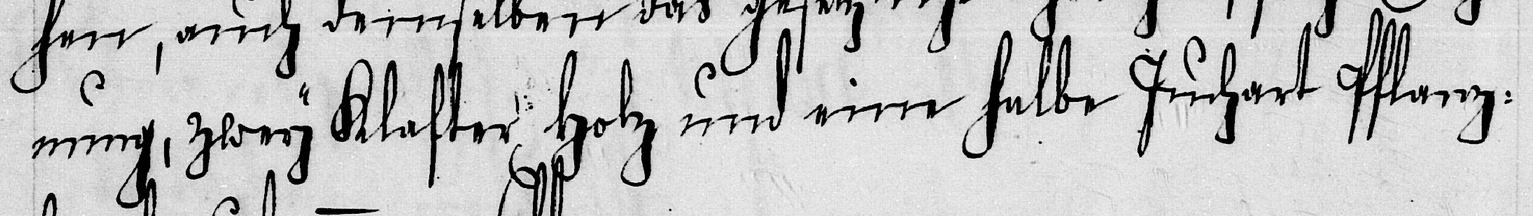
hnung, zwey Klafter Holz und eine halbe Juchart Pflanz¬
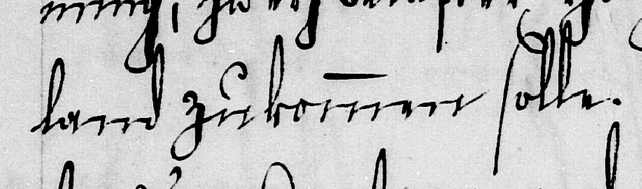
land zukommen solle.
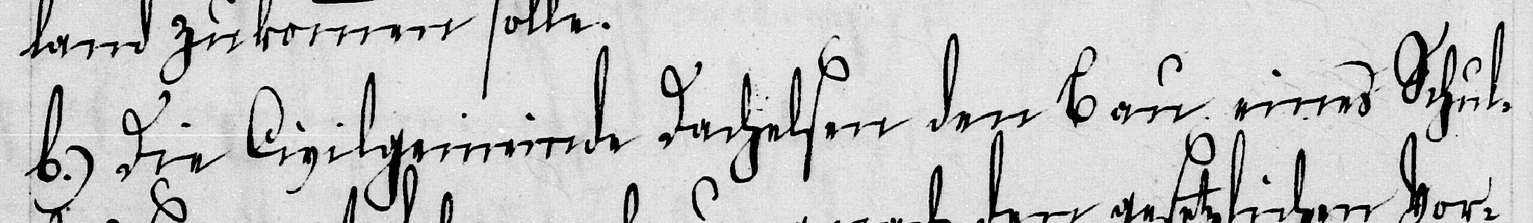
b.) Die Civilgemeinde Dachelsen den Bau eines Schul¬
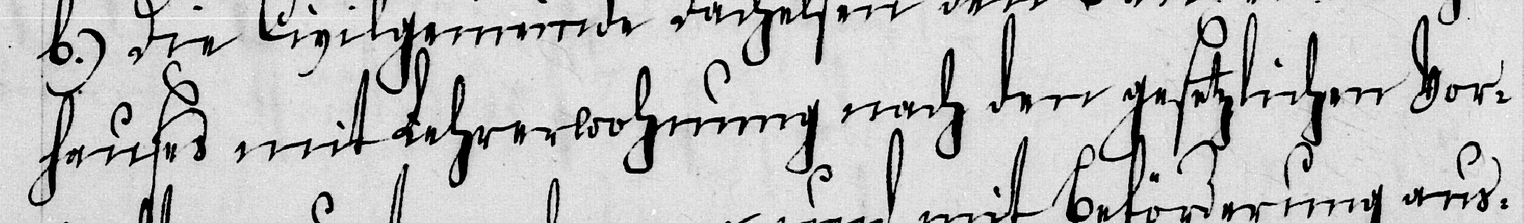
hauses mit Lehrerwohnung nach den gesetzlichen Vor¬
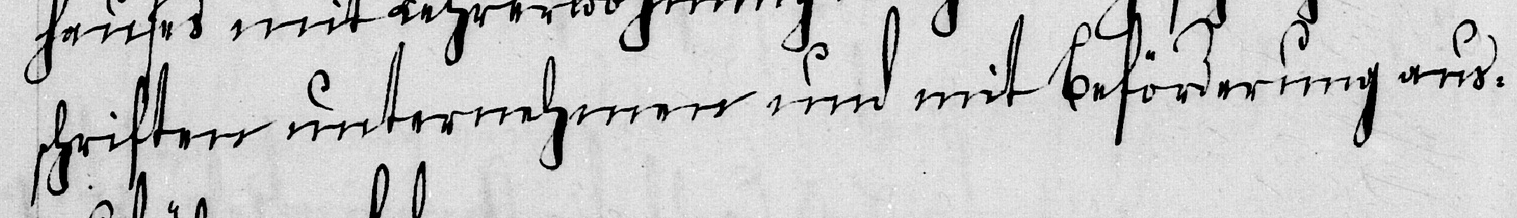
schriften unternehmen und mit Beförderung aus¬
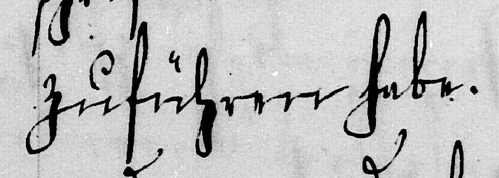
zuführen habe.
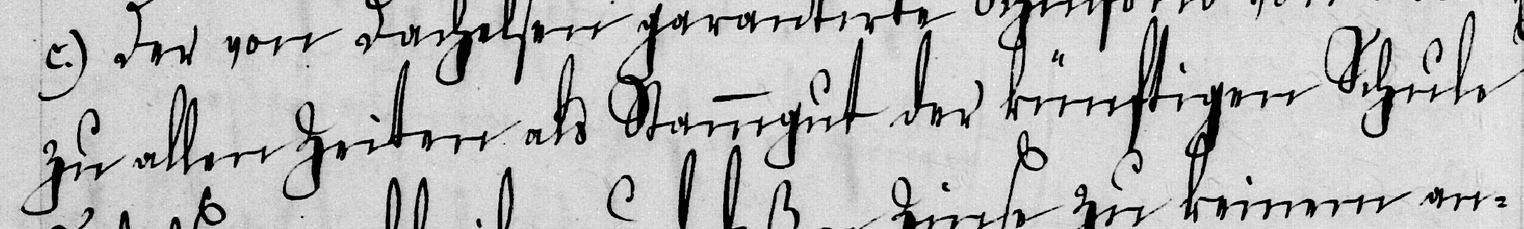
zu aller Zeiten als Stammgut der künftigen Schule
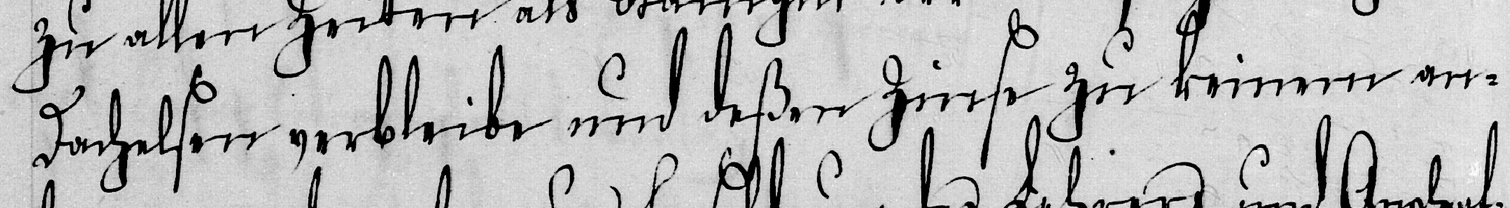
Dachelsen verbleibe und deßen Zinse zu keinem an¬
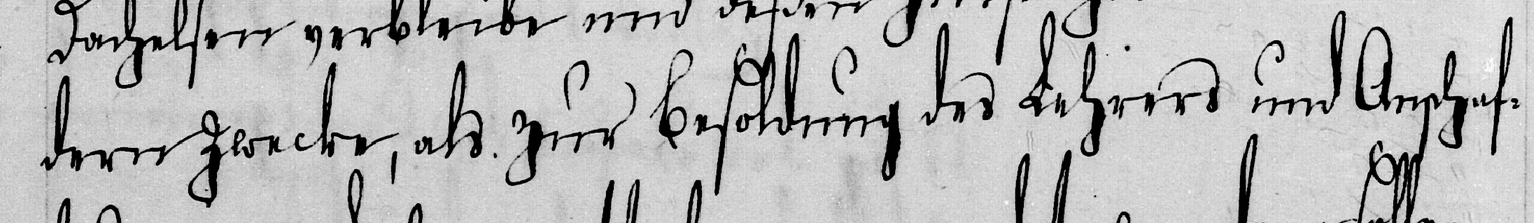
dern Zwecke, als zur Besoldung des Lehrers und Anscha¬
